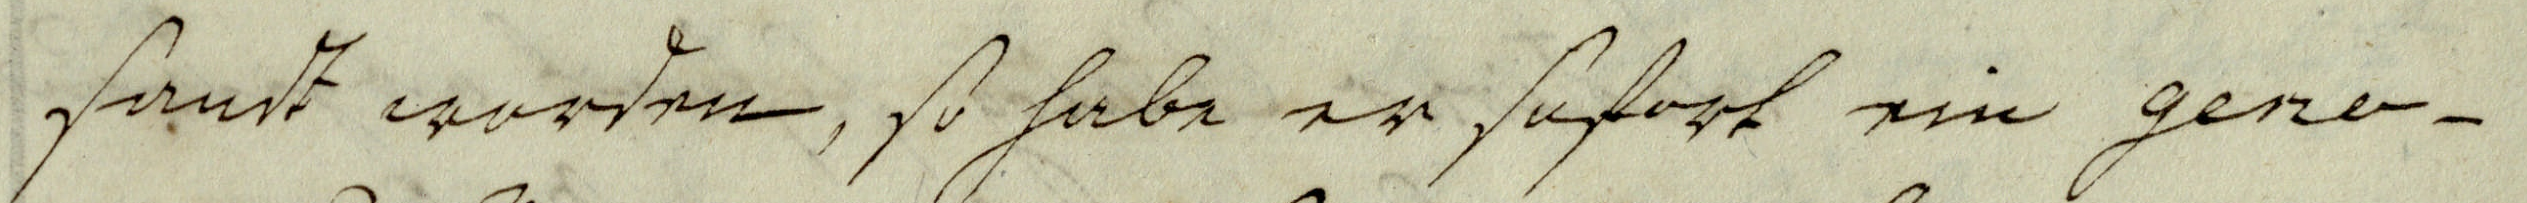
sandt worden, so habe er sofort ein gene¬
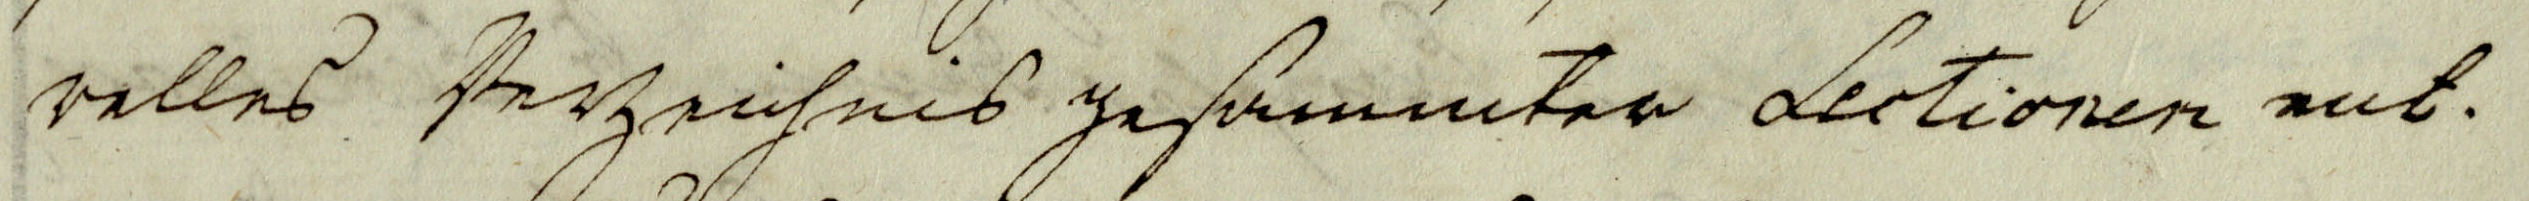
relles Verzeichnis gesammter Lectionen ent¬
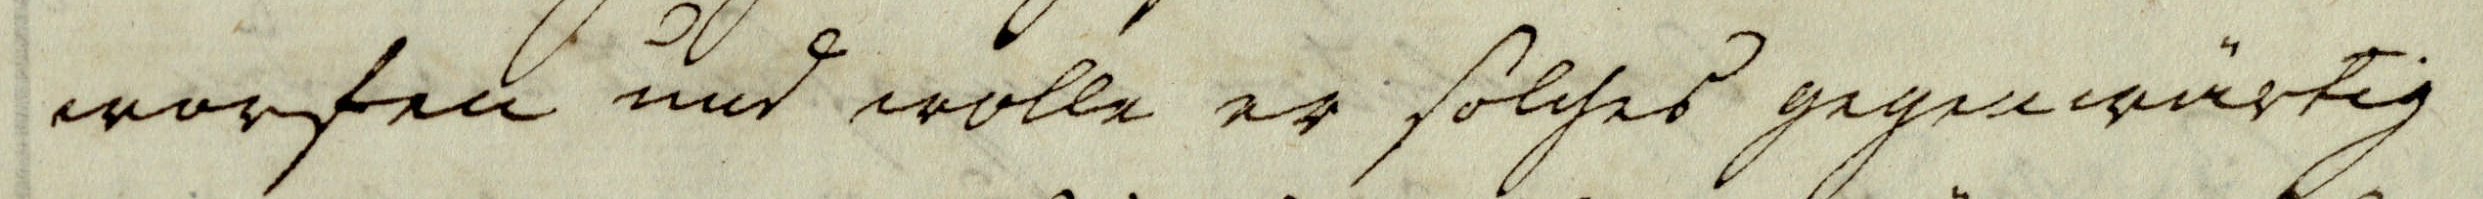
worfen und wolle er solches gegenwärtig
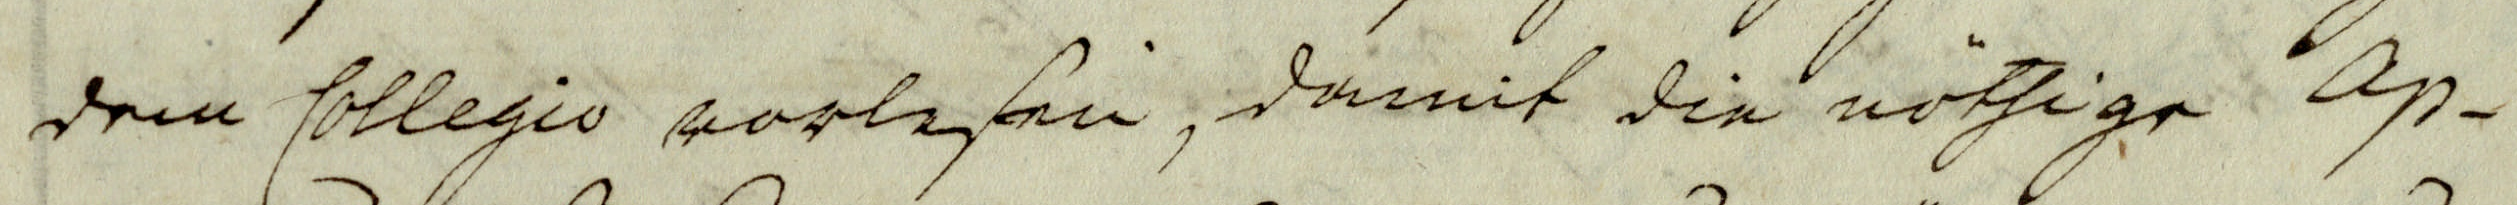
dem Collegio vorlesen, damit die nöthige Ap¬
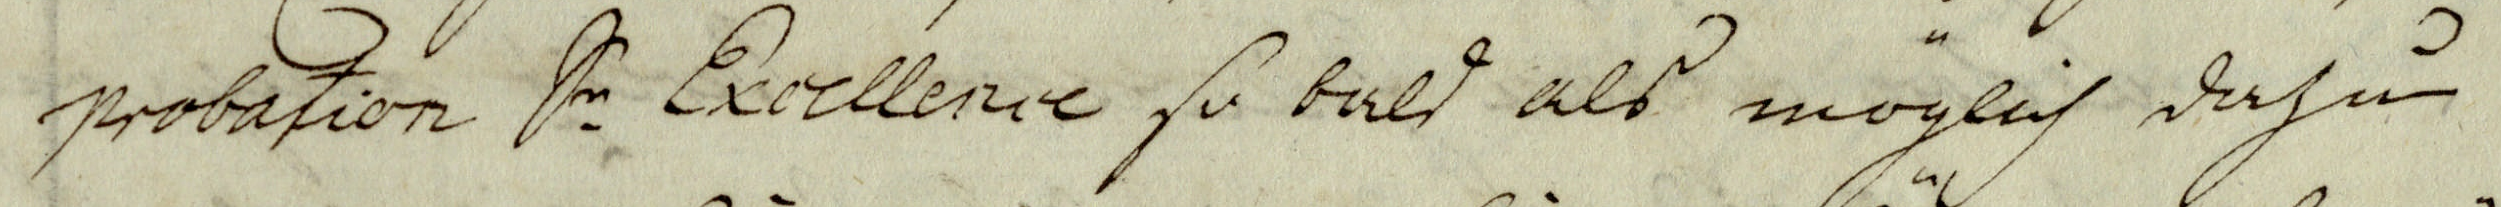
probation Sr. Excellence so bald als möglich dazu
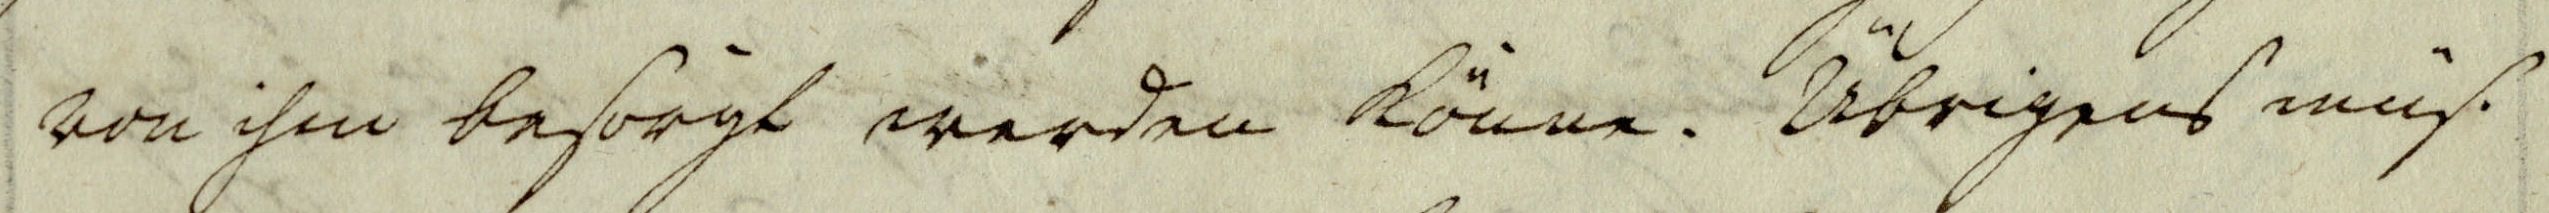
von ihm besorgt werden könne. Übrigens müs¬
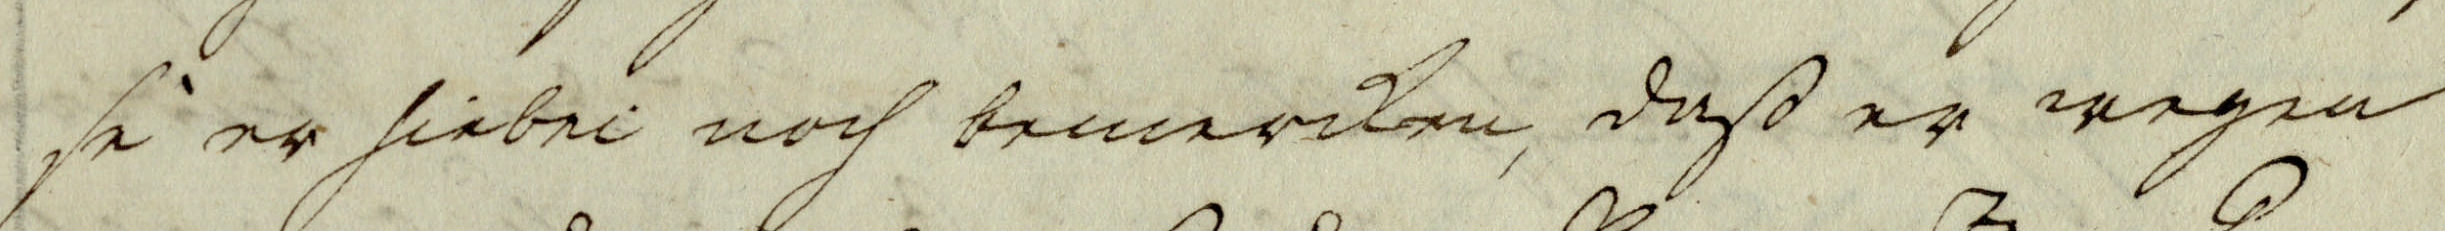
se er hiebei noch bemercken, daß er wegen
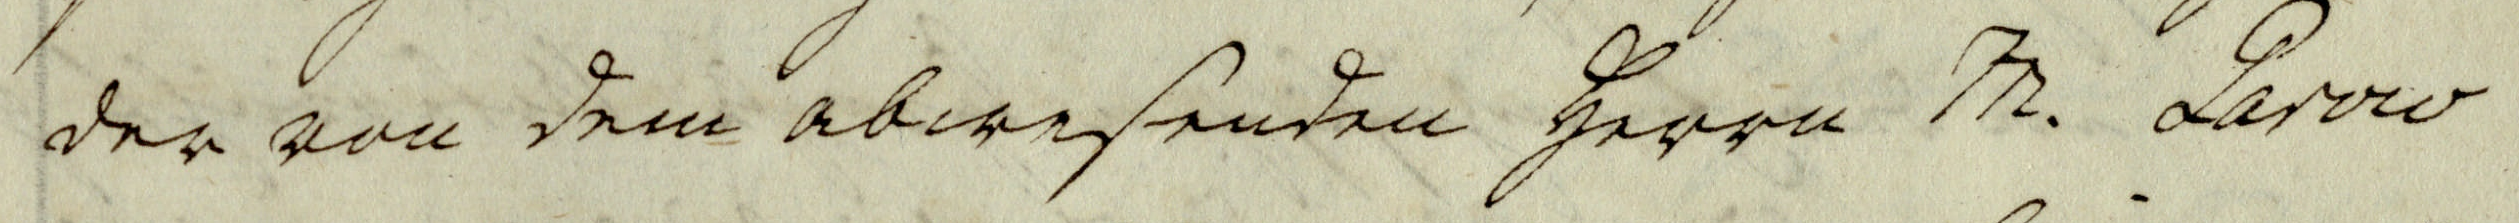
der von dem abwesenden Herrn M. Larow
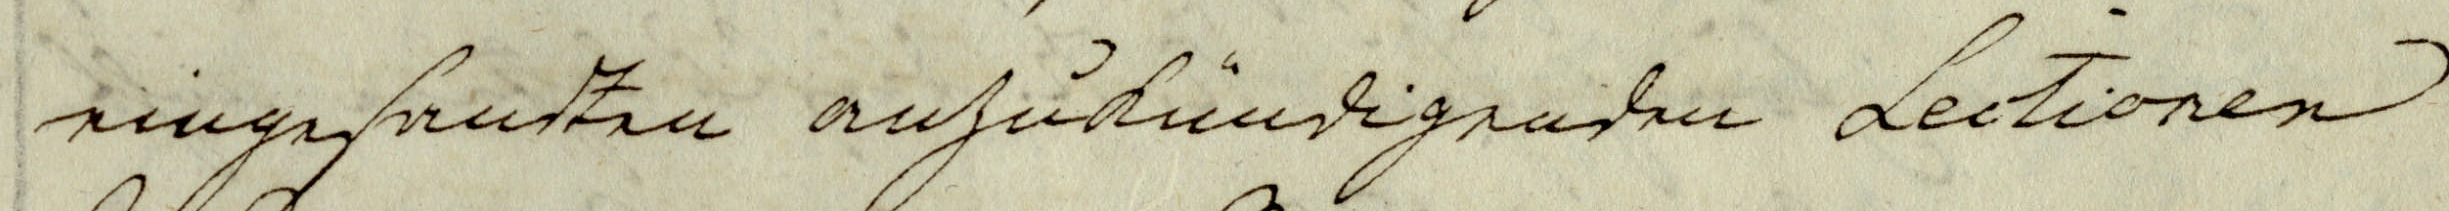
eingesandten anzukündigenden Lectionen
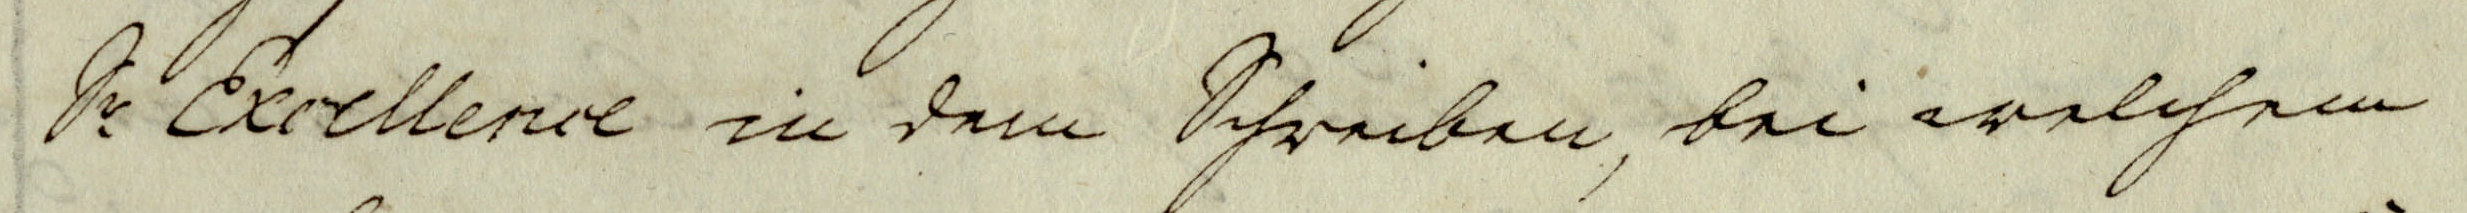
Sr. Excellence in dem Schreiben, bei welchem
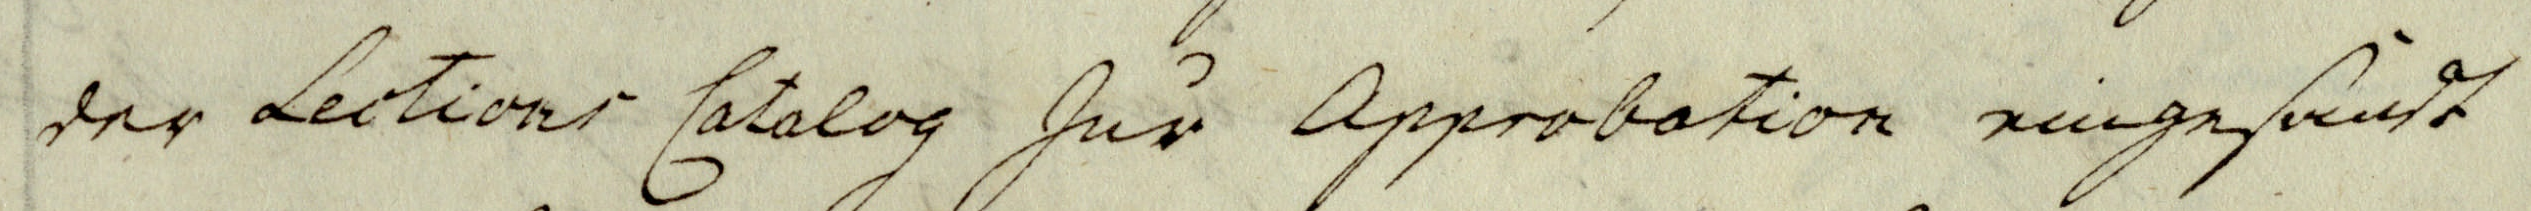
der Lections Catalog zur Approbation eingesandt
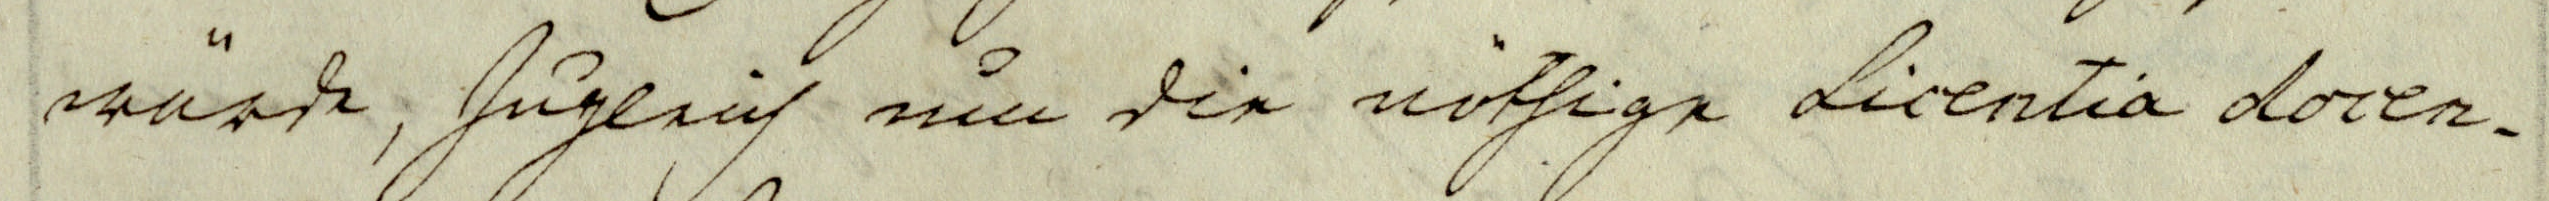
würde, zugleich nun die nöthige Licentia docen¬
